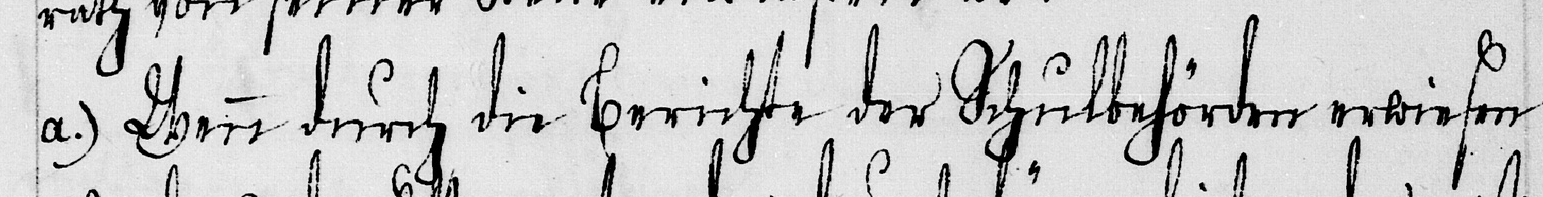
a.) Wenn durch die Berichte der Schulbehörde erwiesen
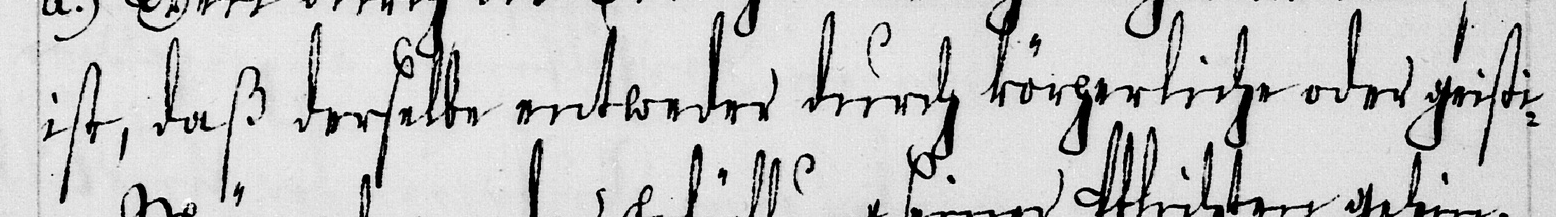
ist, daß derselbe entweder durch körperliche oder geist¬
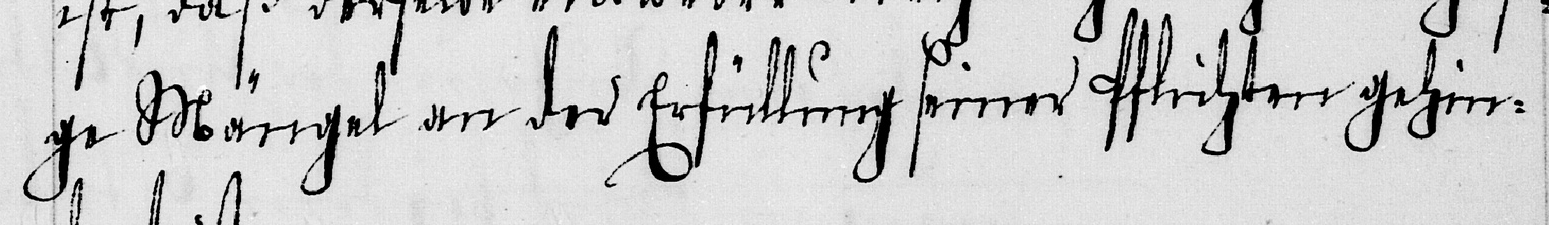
ige Mängel an der Erfüllung seiner Pflichten gehin¬
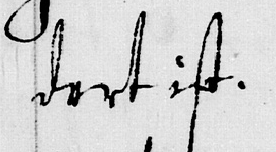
dert ist.
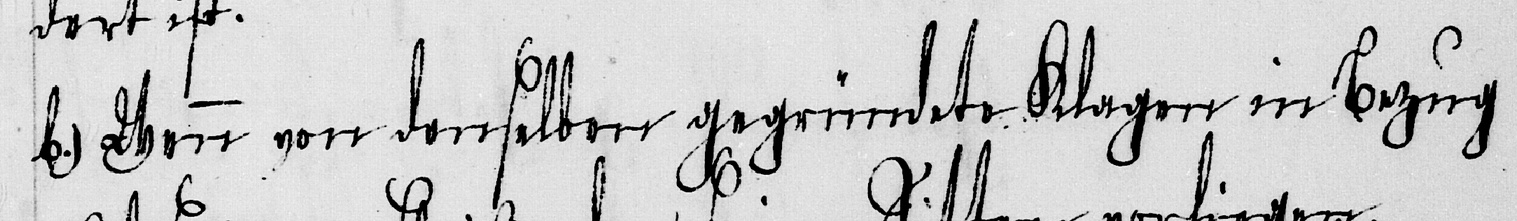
b.) Wenn von denselben gegründete Klagen in Bezug
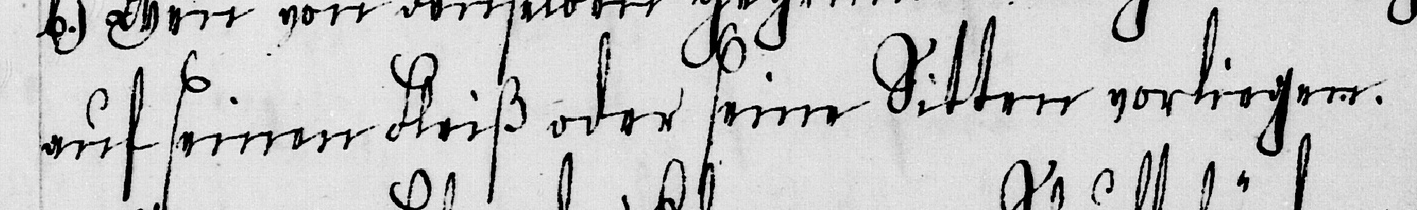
auf seinen Fleiß oder seine Sitten vorliegen.
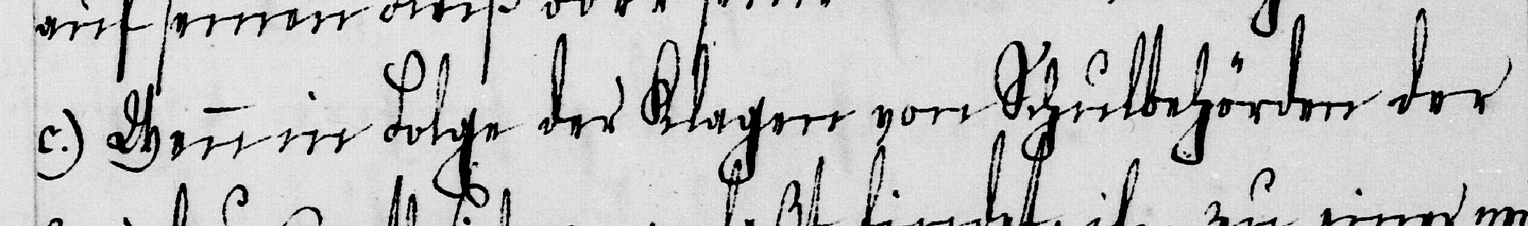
c.) Wenn in Folge der Klagen von Schulbehörden der
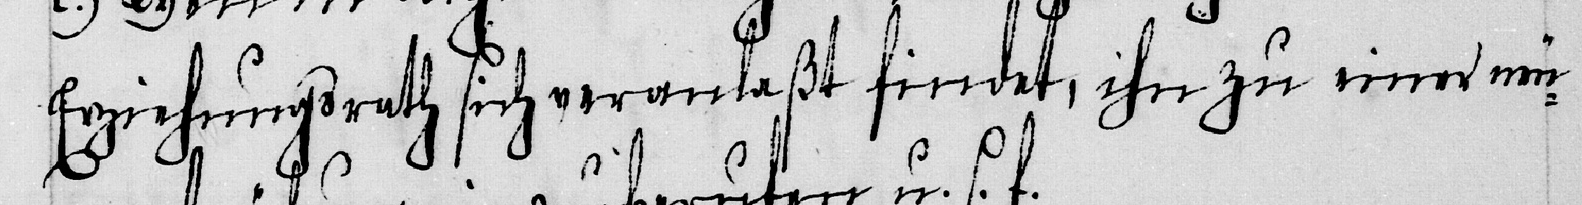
Erziehungsrath sich veranlaßt findet, ihn zu einer neu¬
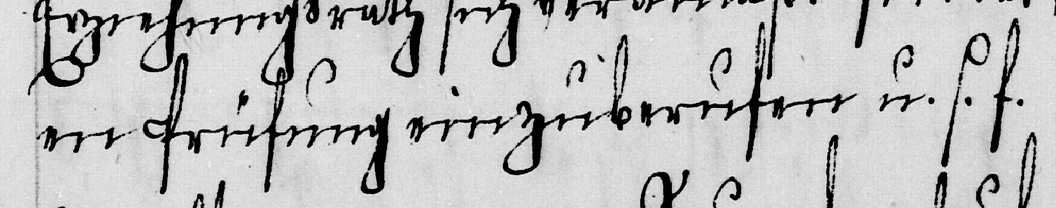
en Prüfung einzuberufen u. s. f.
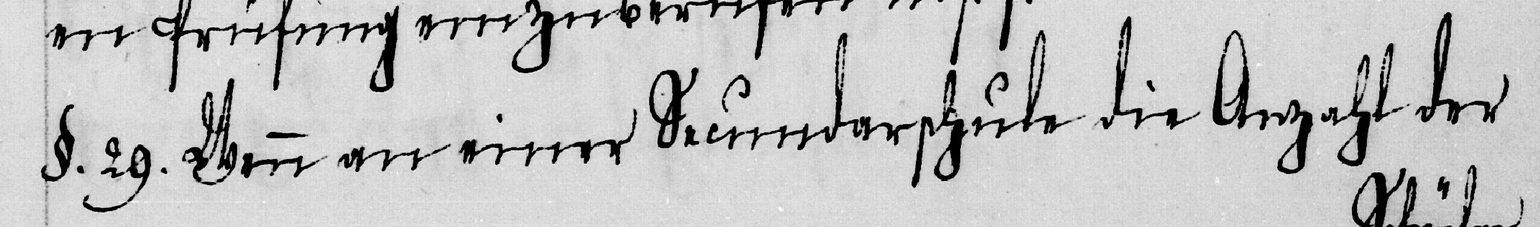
§. 29. Wenn an einer Secundarschule die Anzahl der
